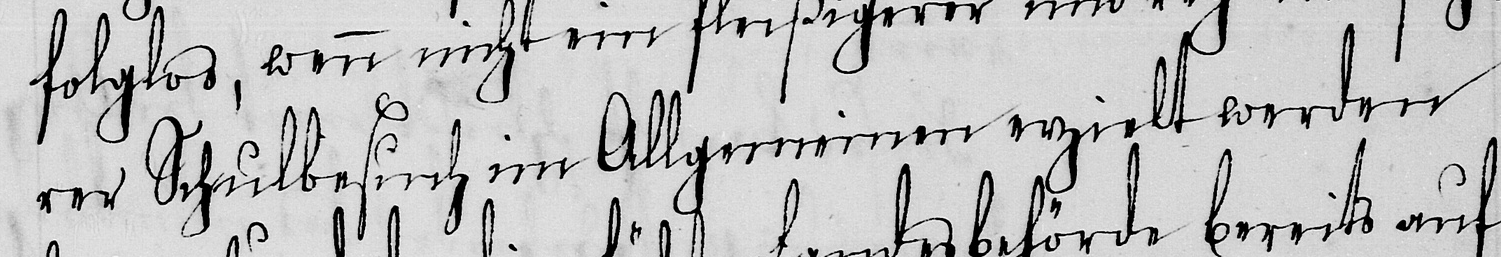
rer Schulbesuch im Allgemeinen erzielt werden
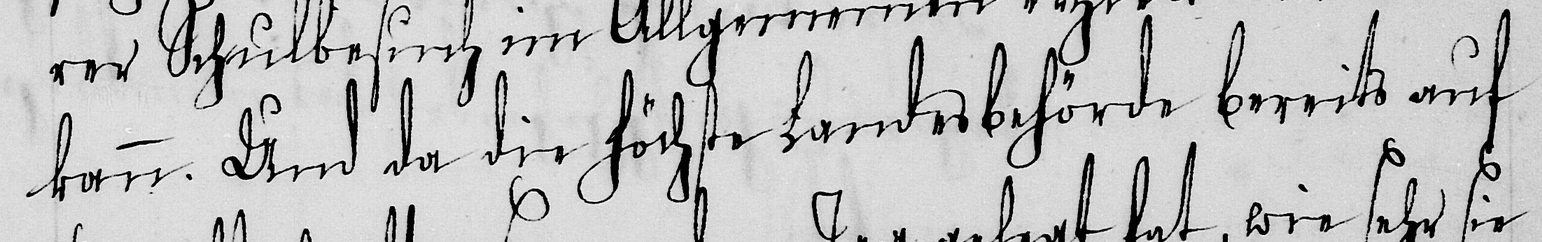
kann. Und da die höchste Landesbehörde bereits auf
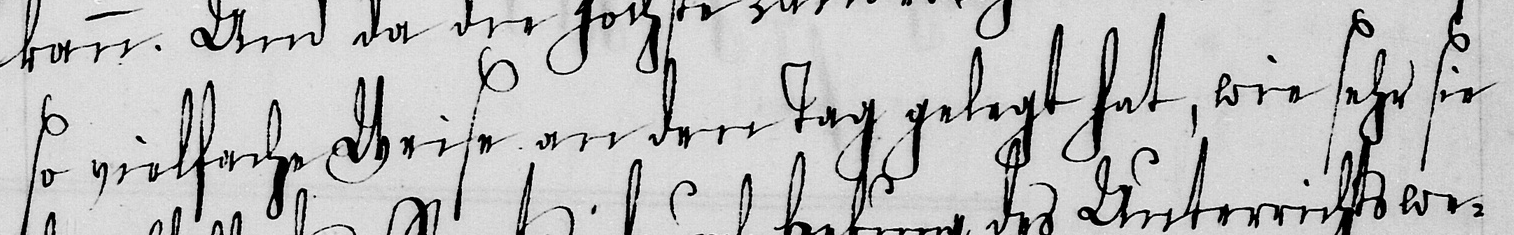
so vielfache Weise an den Tag gelegt hat, wie sehr sie
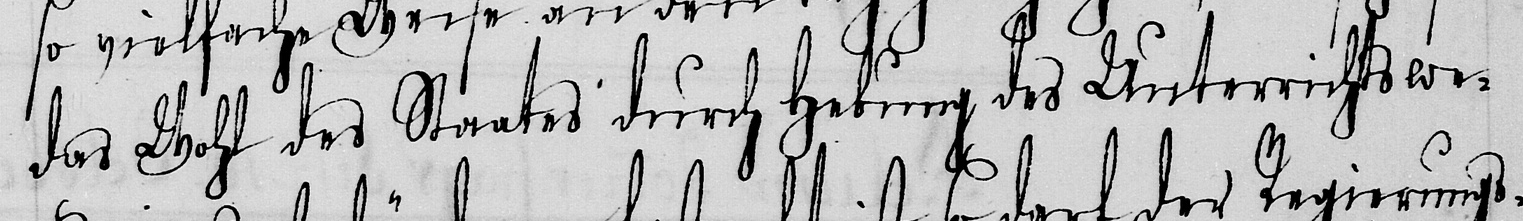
das Wohl des Staates durch Hebung des Unterrichtswe¬
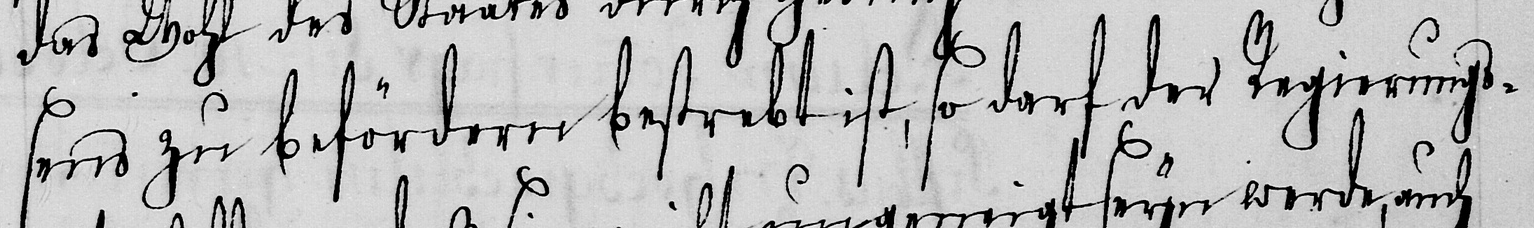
sens zu befördern bestrebt ist, so darf der Regierung¬
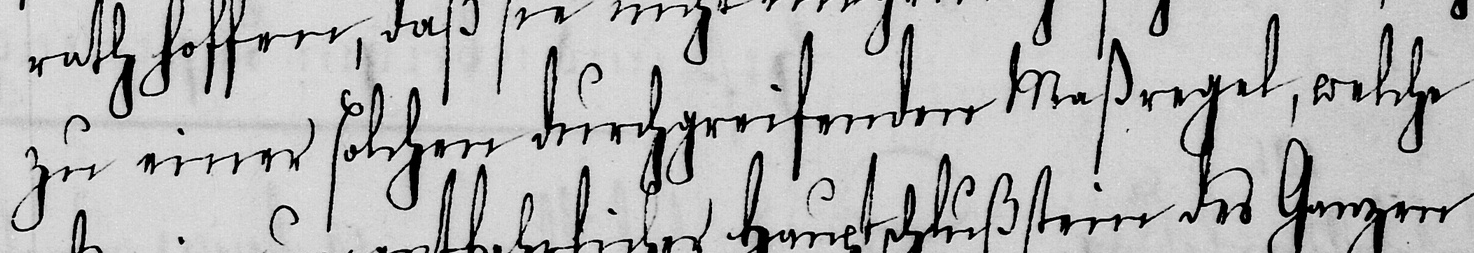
zu einer solchen durchgreifenden Maßregel, welche
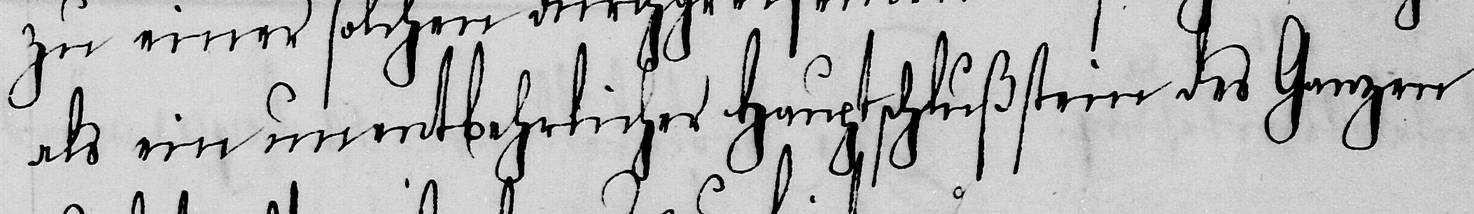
als ein unentbehrlicher Hauptschlußstein des Ganzen
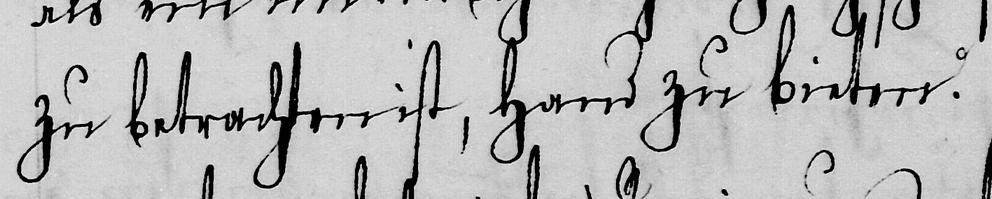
zu betrachten ist, Hand zu bieten.
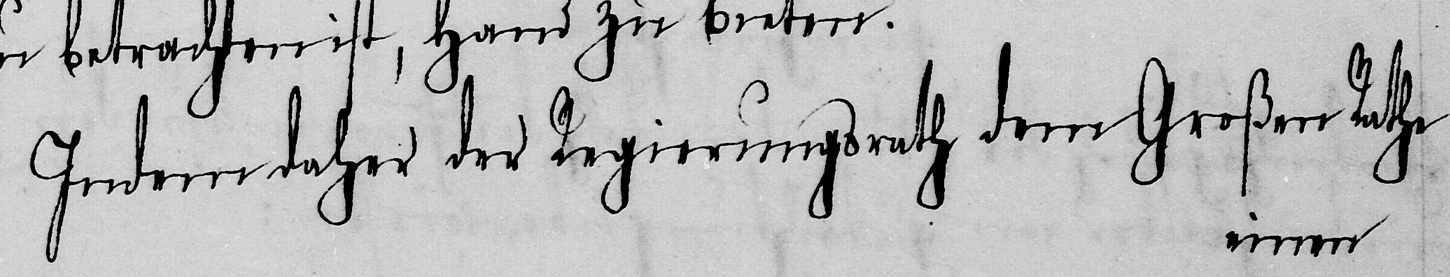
Indem daher der Regierungsrath dem Großen Rathe
